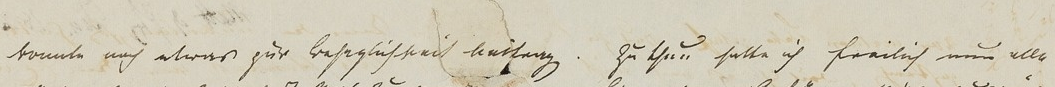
konnte noch etwas zur Behaglichkeit beitragen. Zu thun hatte ich freilich nun alle
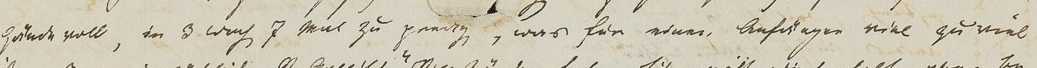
Hände voll, in 3 Wochen 7 Mal zu predigen, was für einen Anfänger viel zu viel
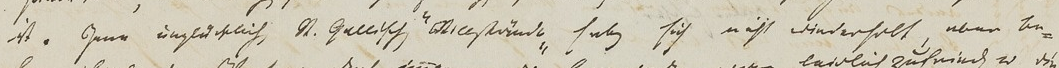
ist. Jene unglücklichen St. Gallischen «Stillstände» haben sich nicht wiederholt, aber be-
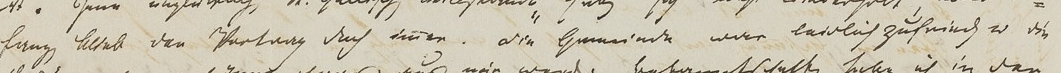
fangen blieb der Vortrag doch immer. Die Gemeinde war leidlich zufrieden u die
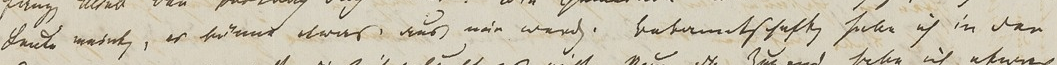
Leute meinten, es könne etwas aus mir werden. Bekanntschaften habe ich in der
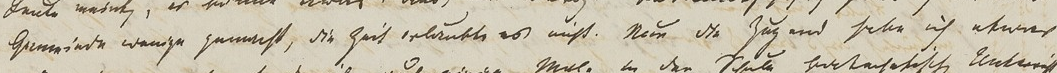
Gemeinde wenige gemacht, die Zeit erlaubte es nicht. Nur die Jugend habe ich etwas
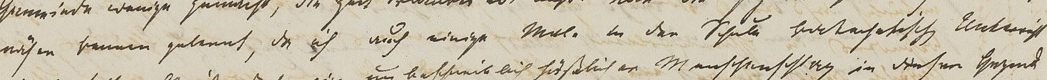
näher kennen gelernt, da ich auch einige Male in der Schule katechetischen Unterricht
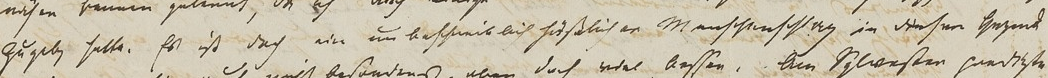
zu geben hatte. Es ist doch ein unbeschreiblich häßlicher Menschenschlag in dieser Gegend.
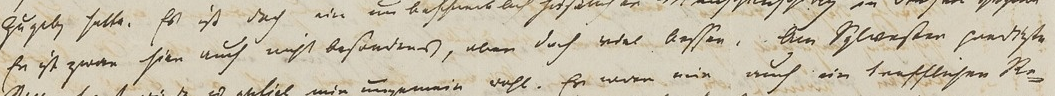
Er ist zwar hier auch nicht besonders, aber doch viel besser. Am Sylvester predigte
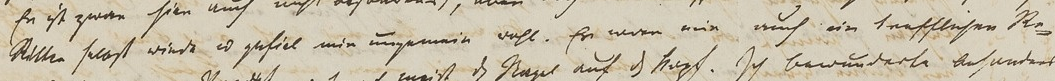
Ritter selbst wiede u gefiel mir ungemein wohl. Er war mir auch ein trefflicher Re-
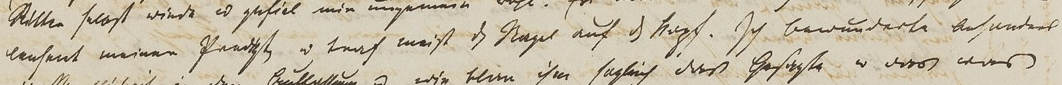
censent meiner Predigten u traf meist den Nagel auf den Kopf. Ich bewunderte besonders
